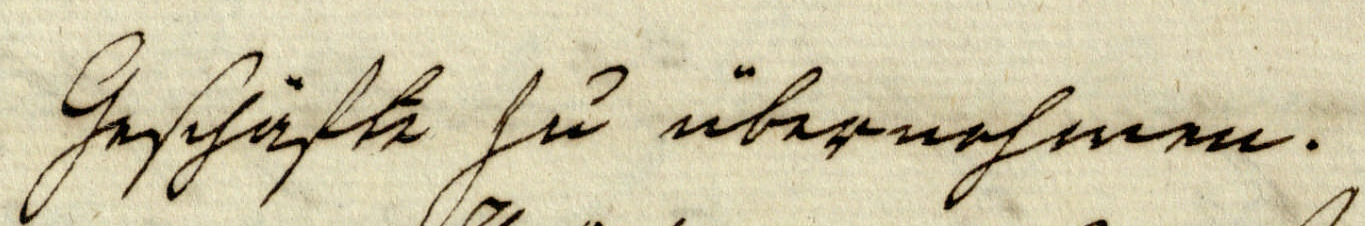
Geschäfte zu übernehmen.
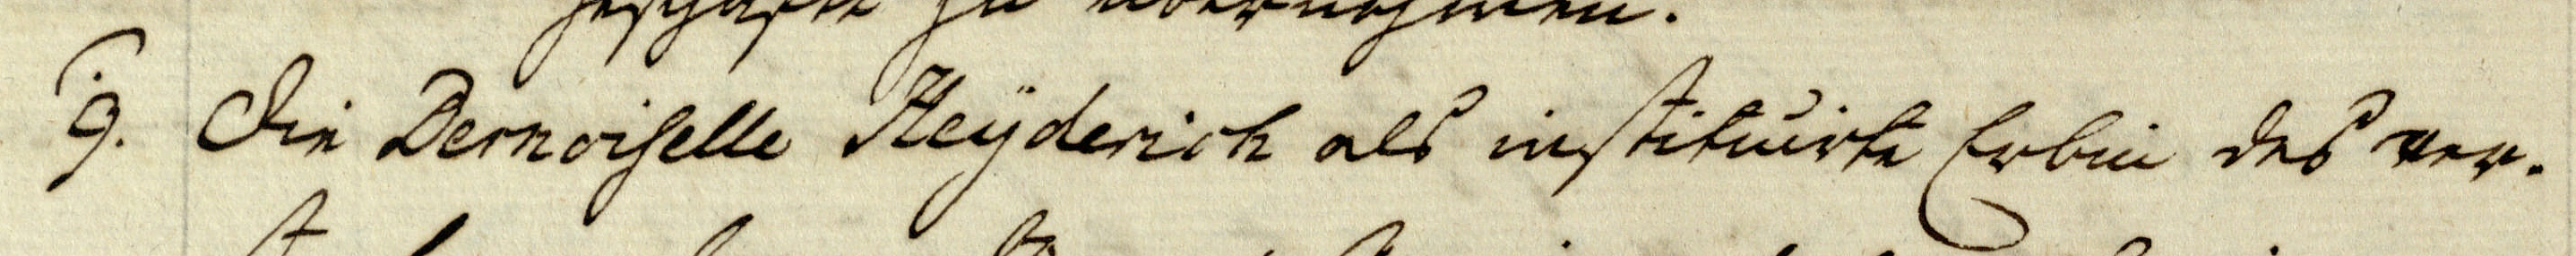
9. Die Demoiselle Heÿderich als instituirte Erbin des ver¬
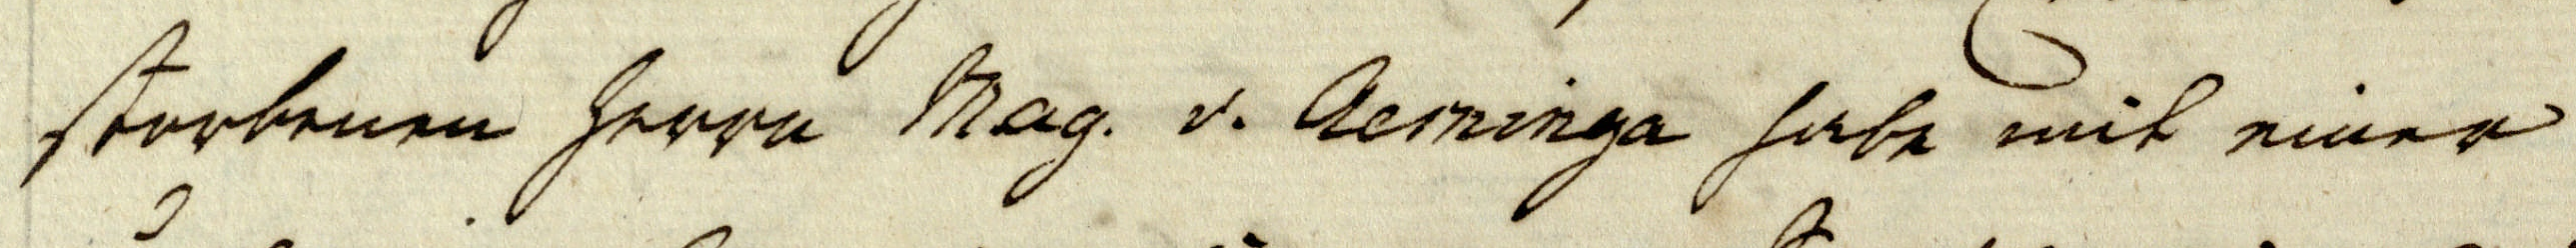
storbenen Herrn Mag. v. Aeminga habe mit einer
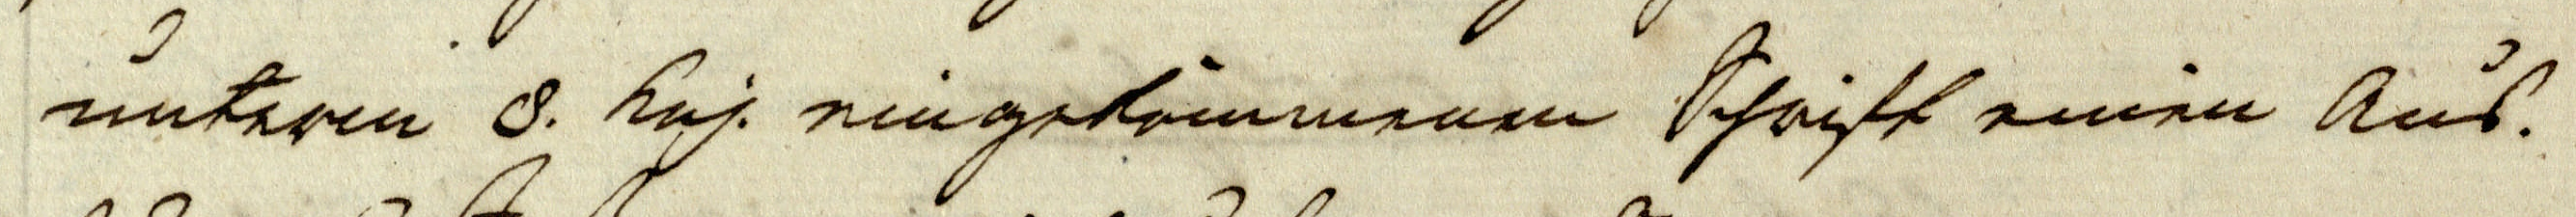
unterm 8. huj. eingekommenen Schrift einen Aus¬
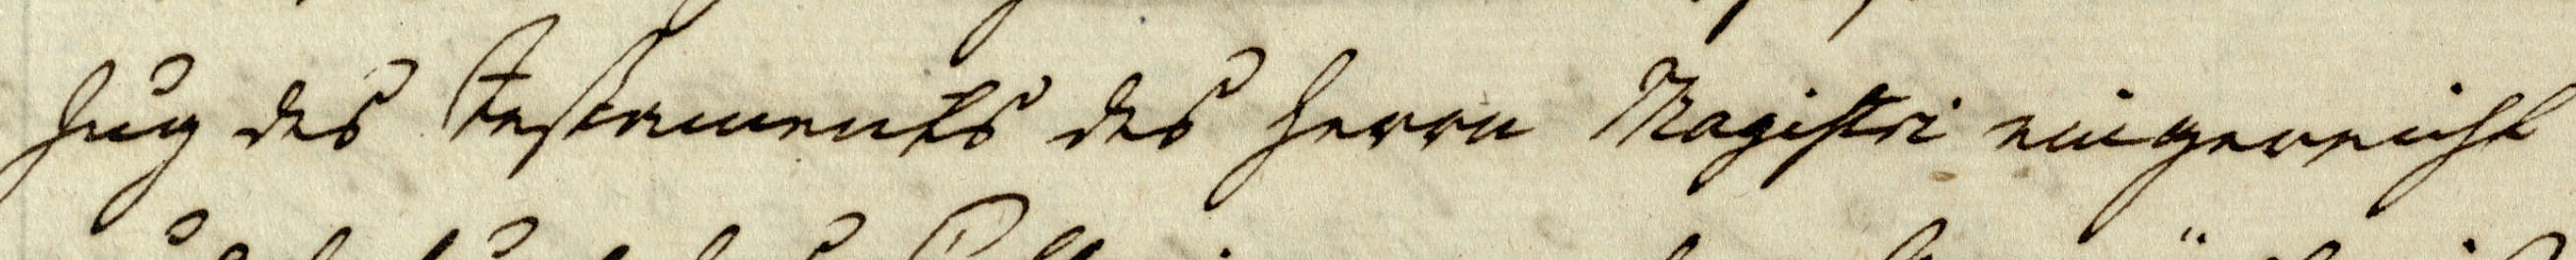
zug des Testaments des Herrn Magistri eingereicht
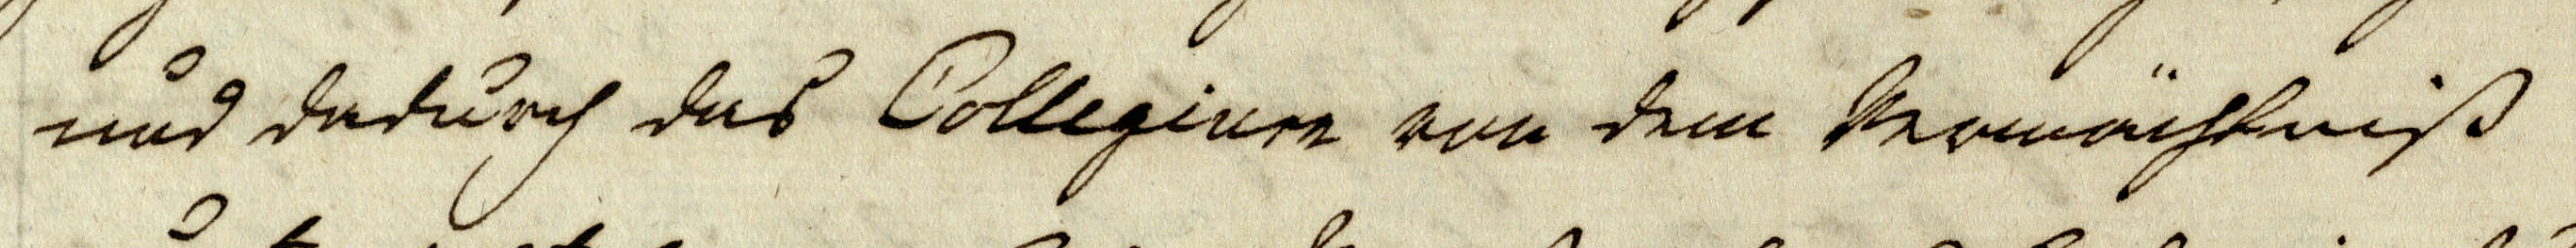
und dadurch das Collegium von dem Vermachtniß
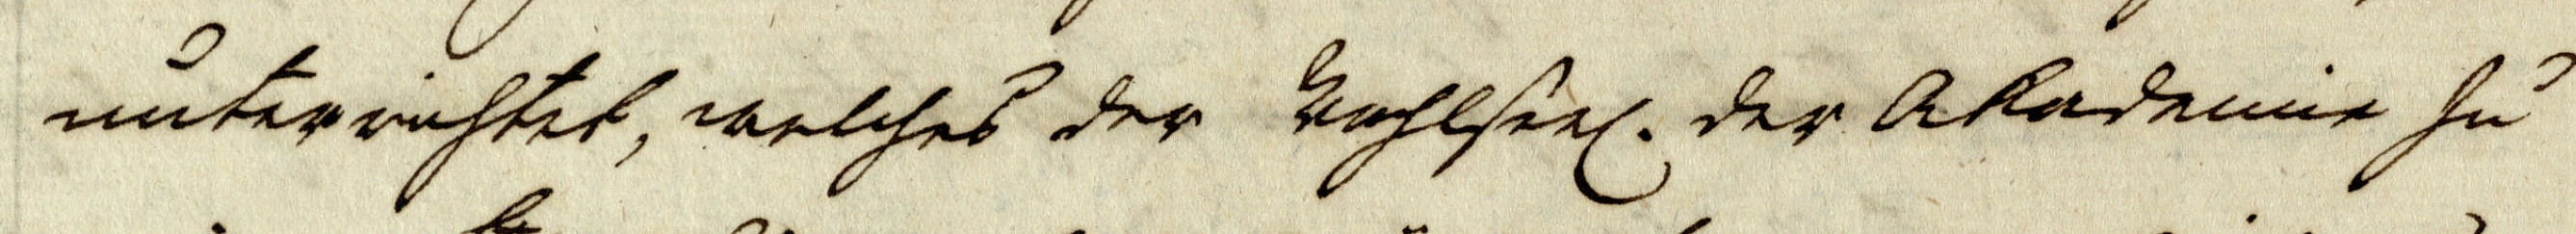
unterrichtet, welches der Wohlseel. der Akademie zu
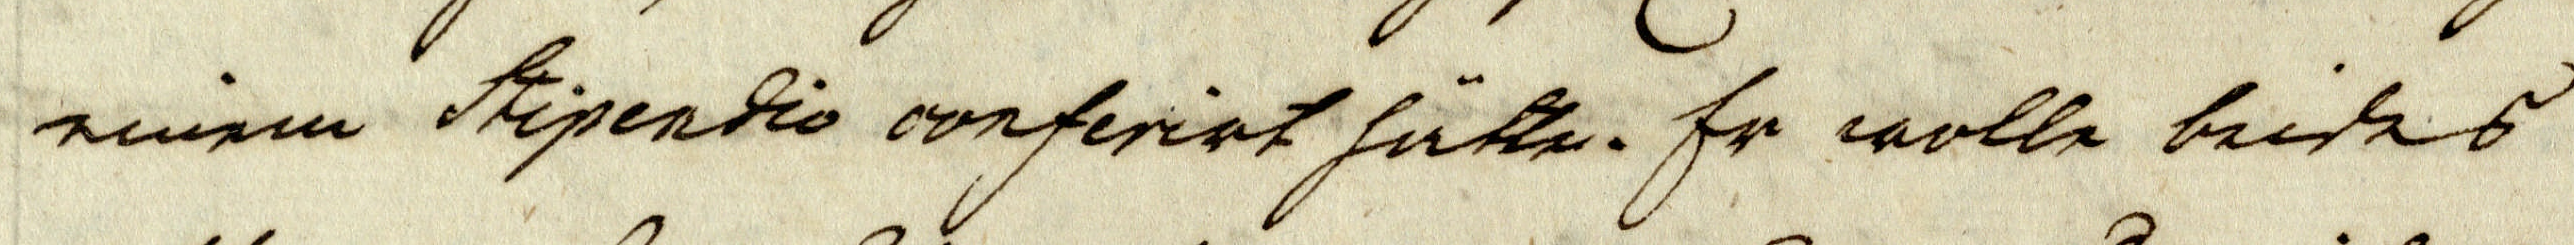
einem Stipendio conferirt hätte. Er wolle beides
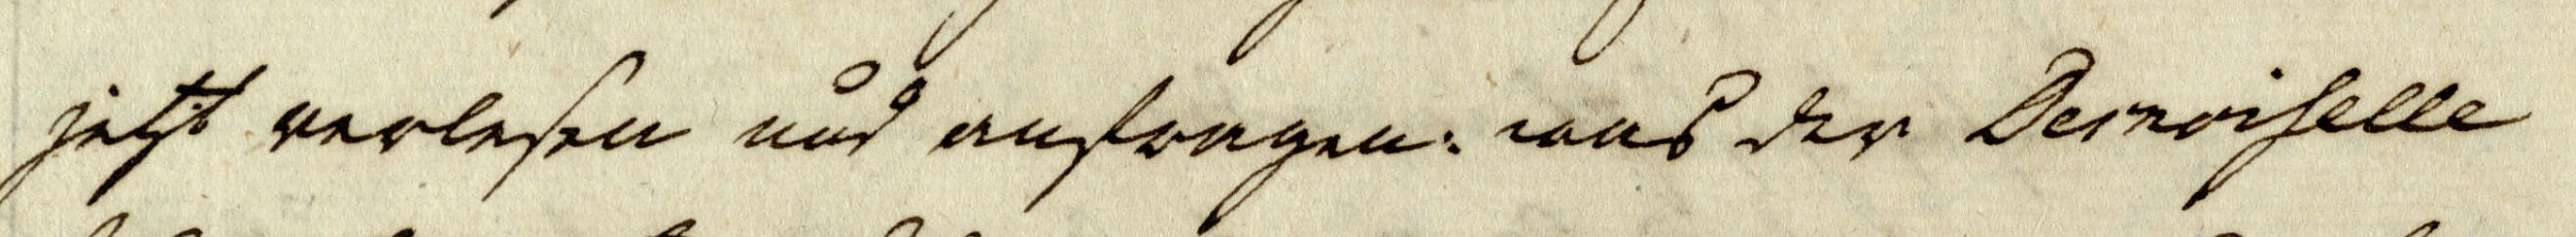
jetzt verlesen und anfragen: was der Demoiselle
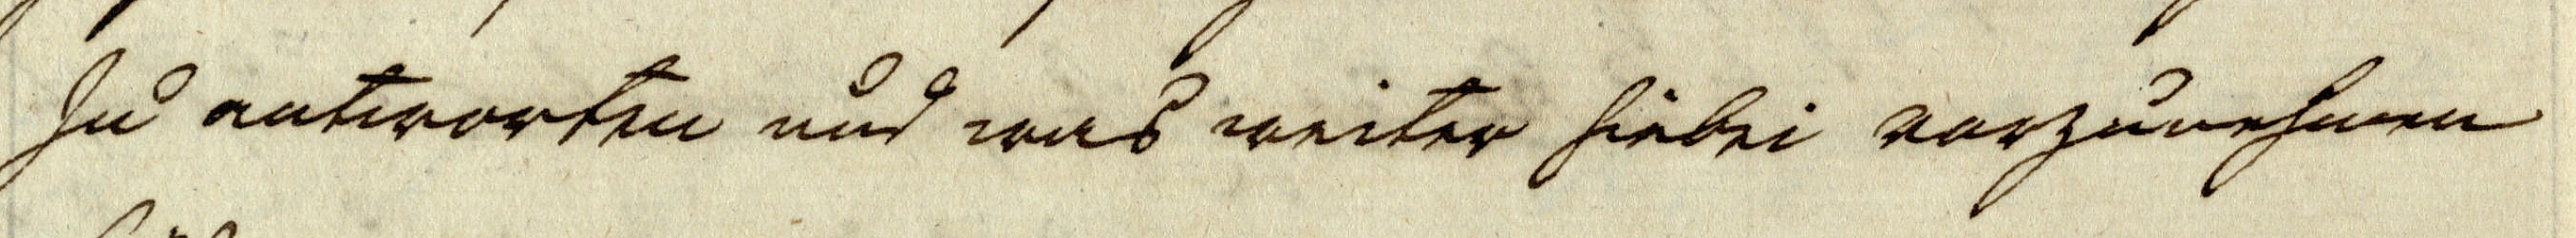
zu antworten und was weiter hiebei vorzunehmen
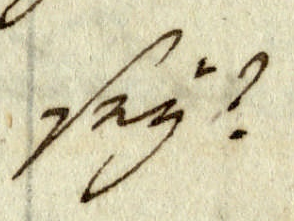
seÿ?
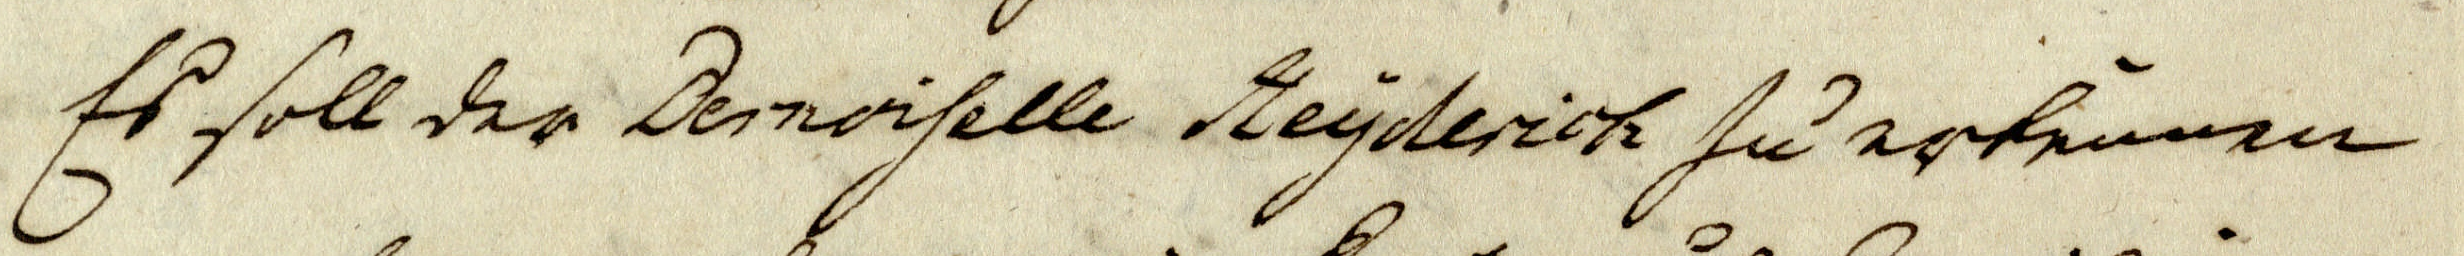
Es soll der Demoiselle Heÿderich zu erkennen
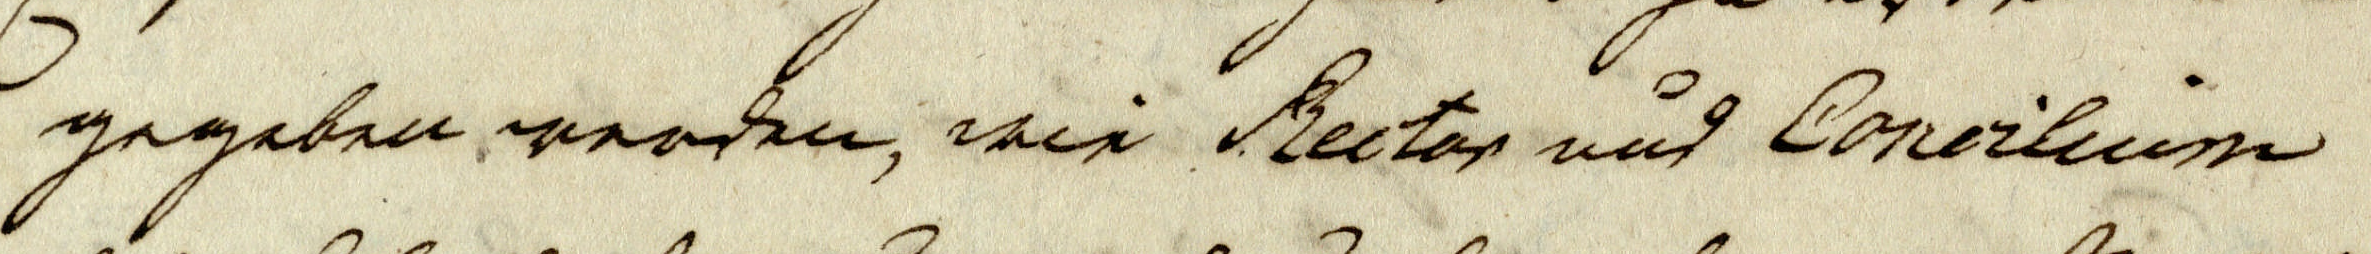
gegeben werden, wie Rector und Concilium
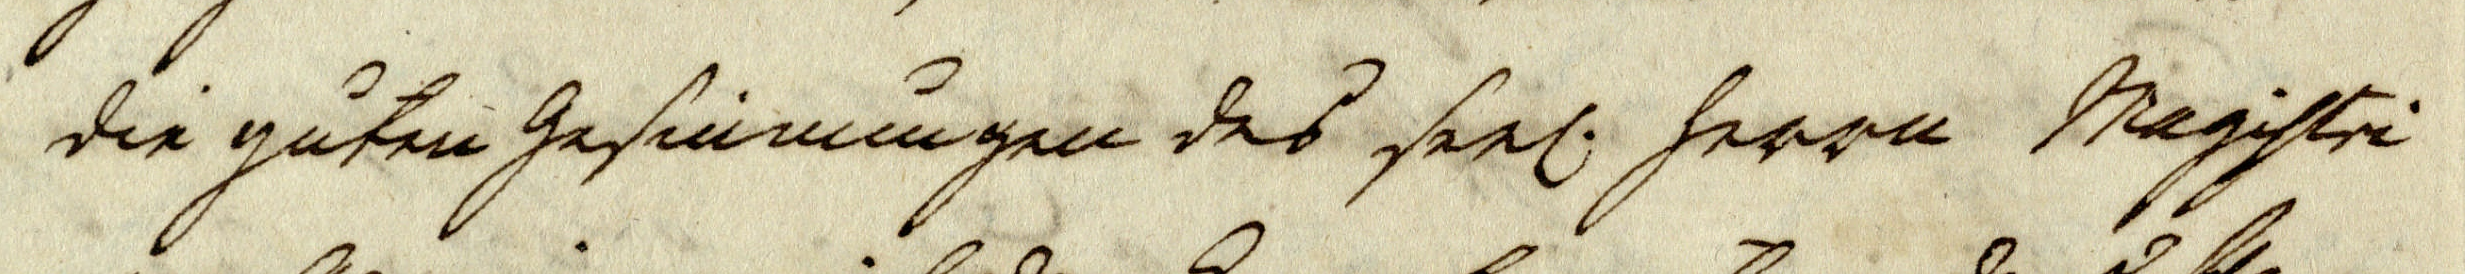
die guten Gesinnungen des seel. Herrn Magistri
